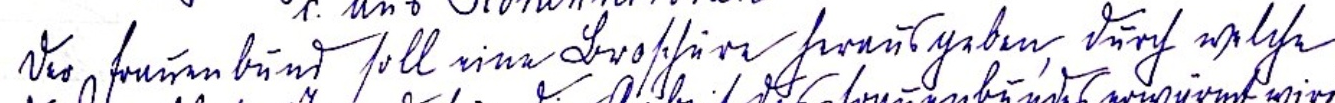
Der Frauenbund soll eine Broschüre herausgeben, durch welche
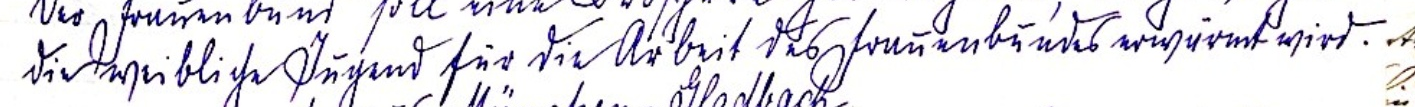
die weibliche Jugend für die Arbeit des Frauenbundes erwärmt wird.
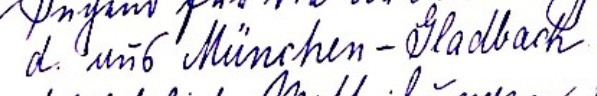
d. aus München-Gladbach
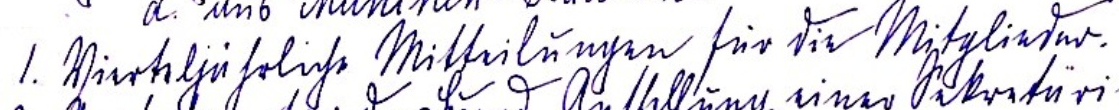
1. Vierteljährliche Mitteilungen für die Mitglieder
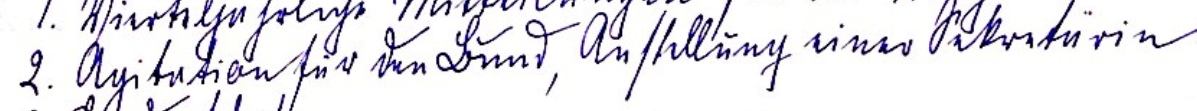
2. Agitation für den Bund, Anstellung einer Sekretärin
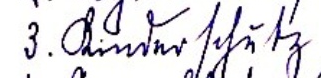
3. Kinderschutz
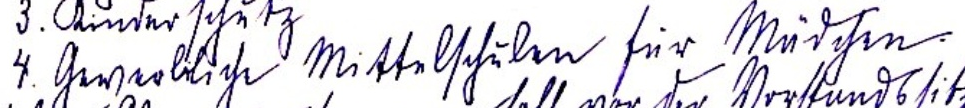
4. Gewerbliche Mittelschulen für Mädchen
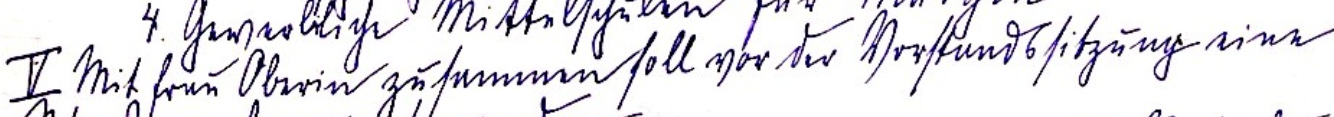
V. Mit Frau Oberin zusammen soll vor Vorstandssitzung eine
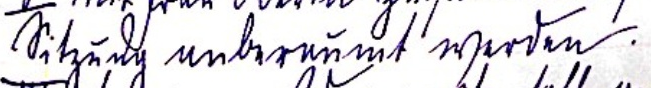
Sitzung anberaumt werden.
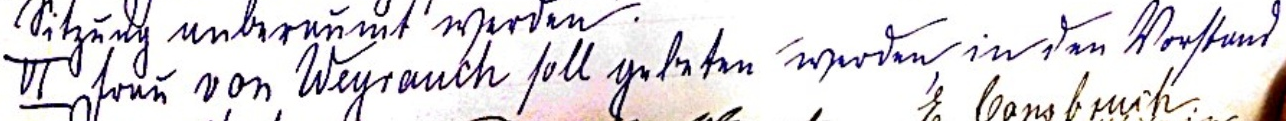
VI. Frau von Weyrauch soll gebeten werden, in den Vorstand
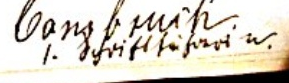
I. Schriftführerin
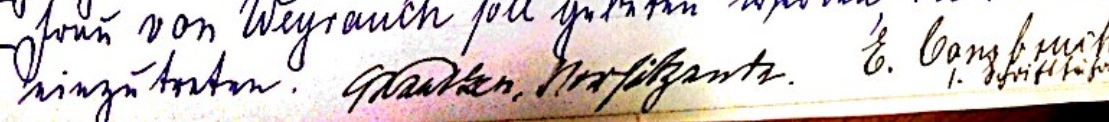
einzutreten. G. Knutzen Vorsitzende E. Consbruck
